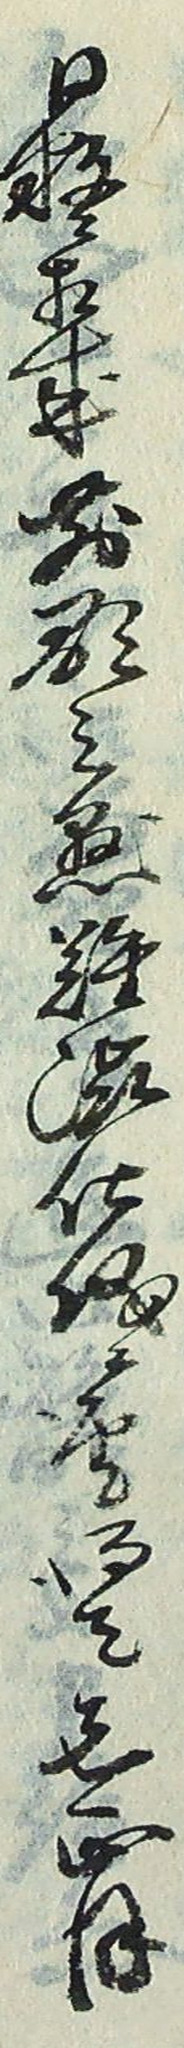日数ニ相成前顕之懸難渋仕儀ニ御坐候得者先正月
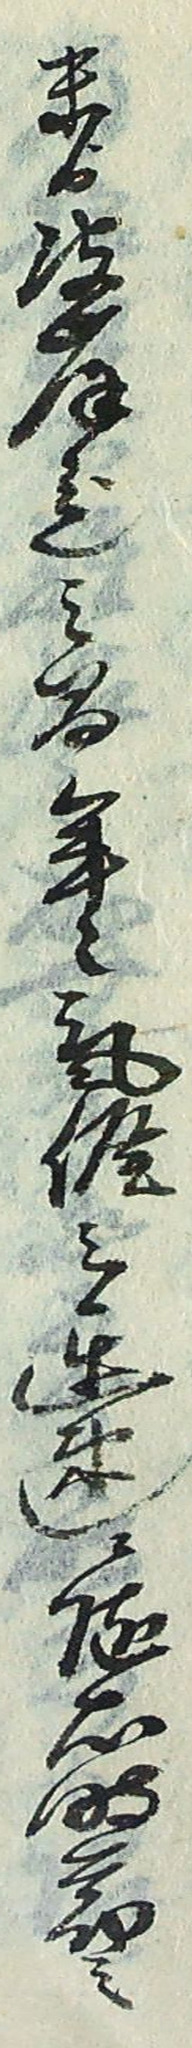末ゟ彼岸迄之間年々気候之遅速ニ随右時節之
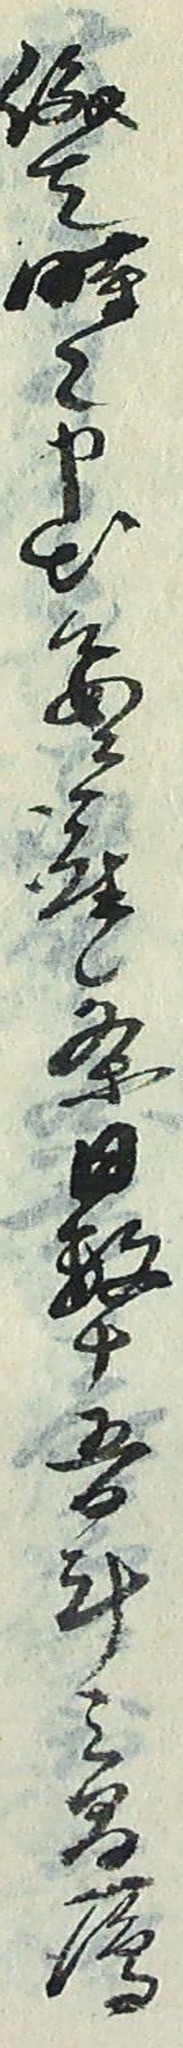儀者時々申出候義ニ御坐候条日数十五日斗之間鴈
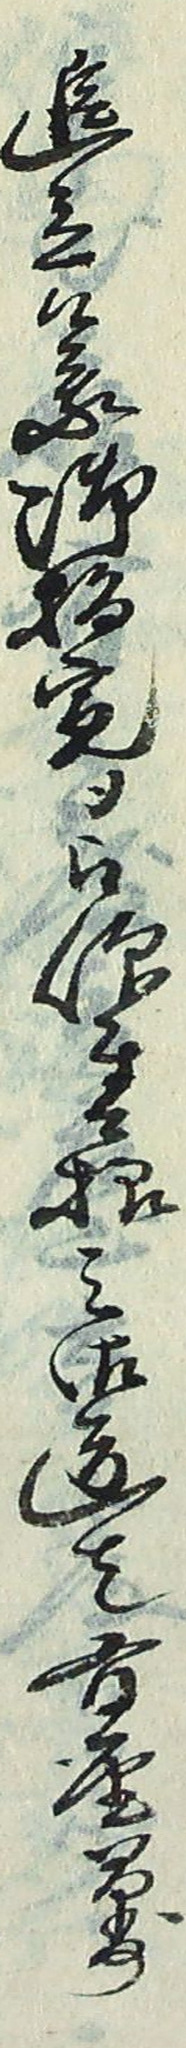追立候義御指寛メ被仰付候様之御道者有御坐間布
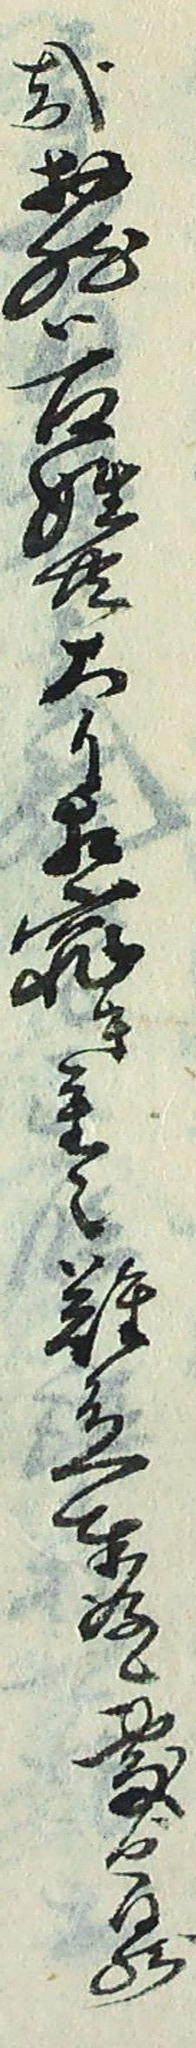哉於然ハ百姓共大に相窕キ重々難有奉存候處ゟ自然
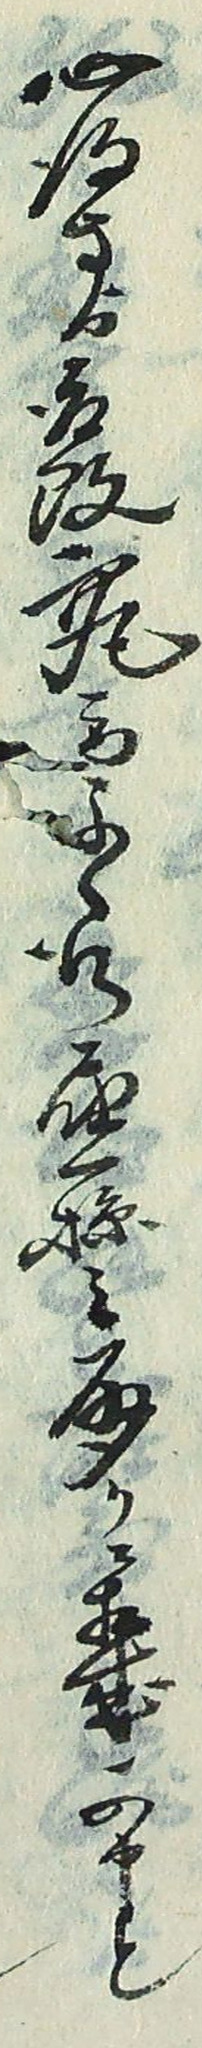心得方ゟ取改究方よく行届様之取〆りニ相成可申と
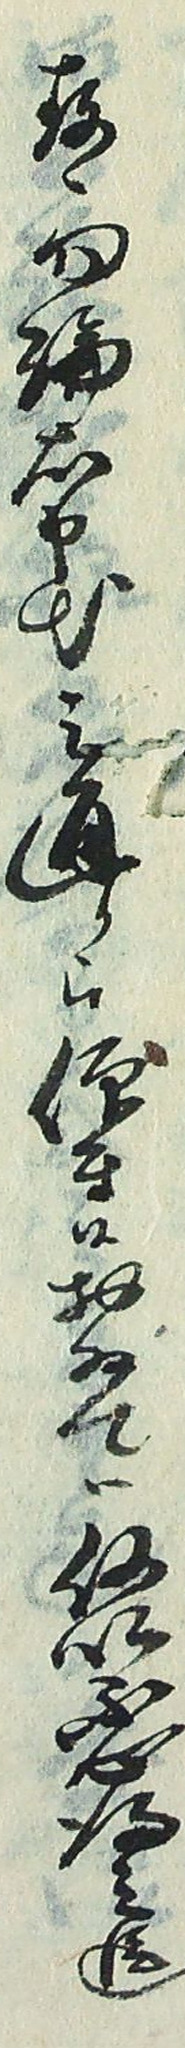存候勿論右申出之通り被仰付候おゐてハ何以不心得之追
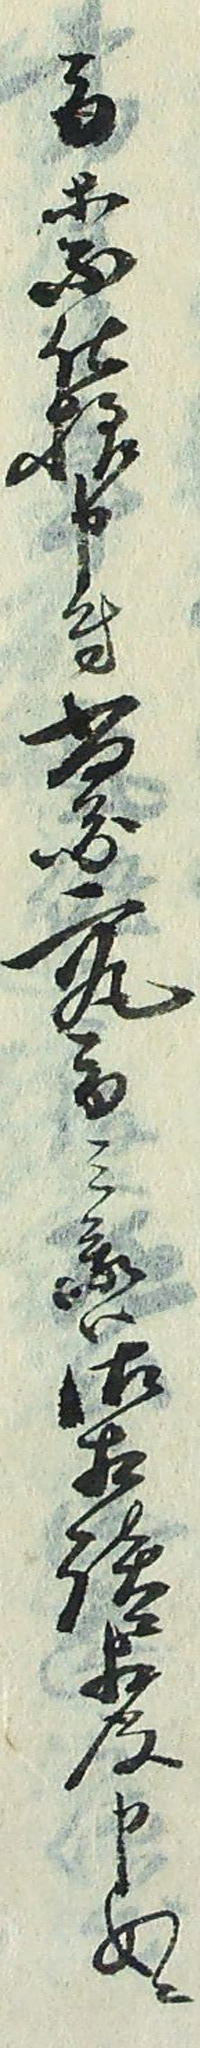方等不仕様申付尚亦究方之義ハ御相談ニ相及申義ニ
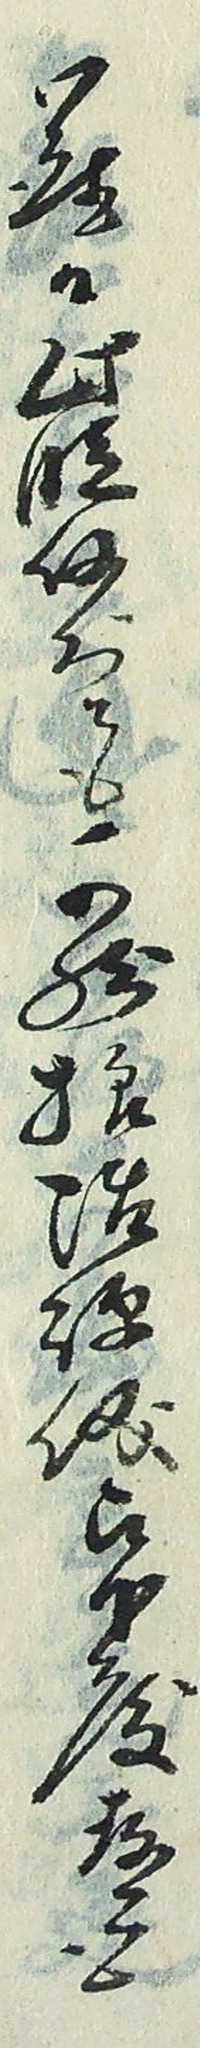御座候此段何分とも可然様御評儀被下度存候以上
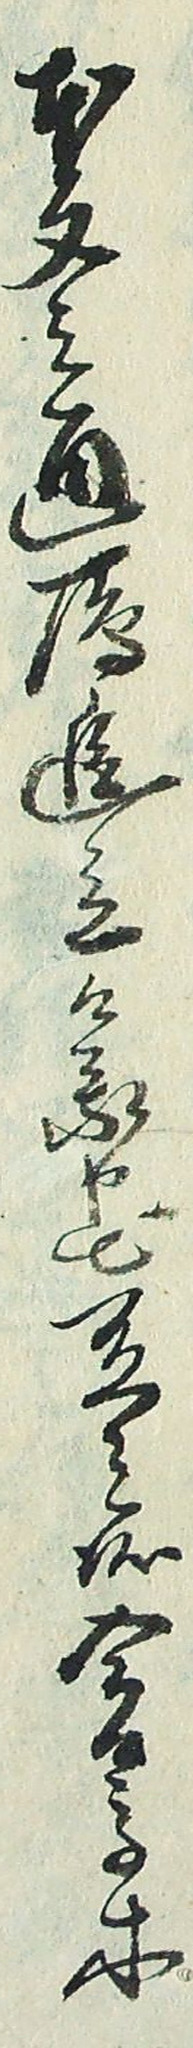本文之通鴈追立候義申出有之所今日高木
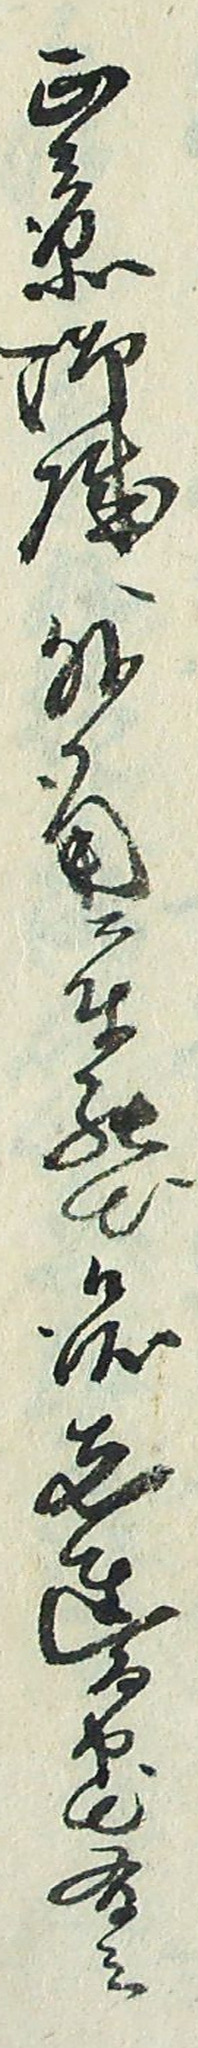正兵衛御城へ外御用ニ付罷出候所先達而申出有之

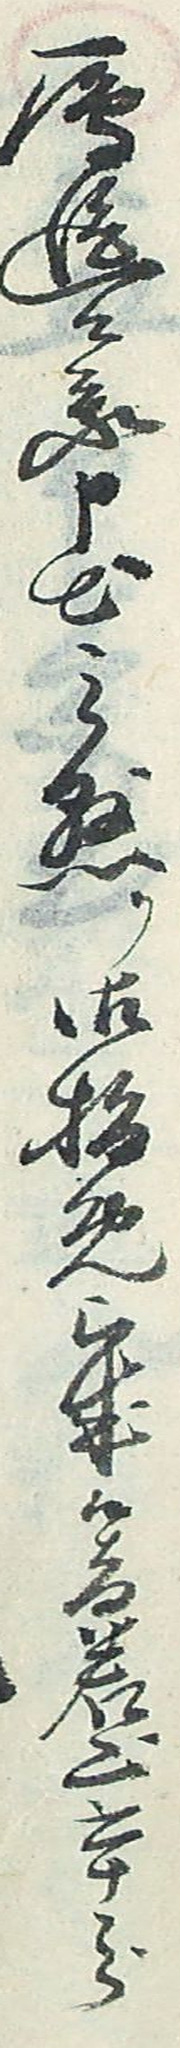鴈追候義申出之懸り御指免被成候旨若山六十郎
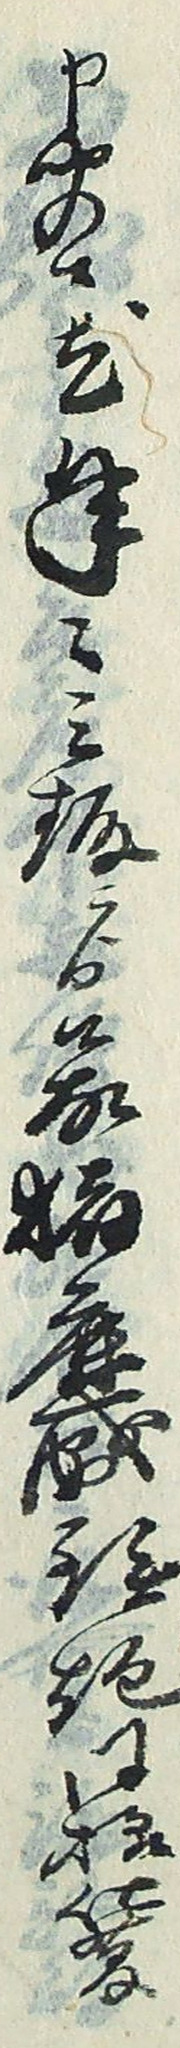申聞候尤年々之趣ニゟ候故猪鹿威鉄砲同様仕菅
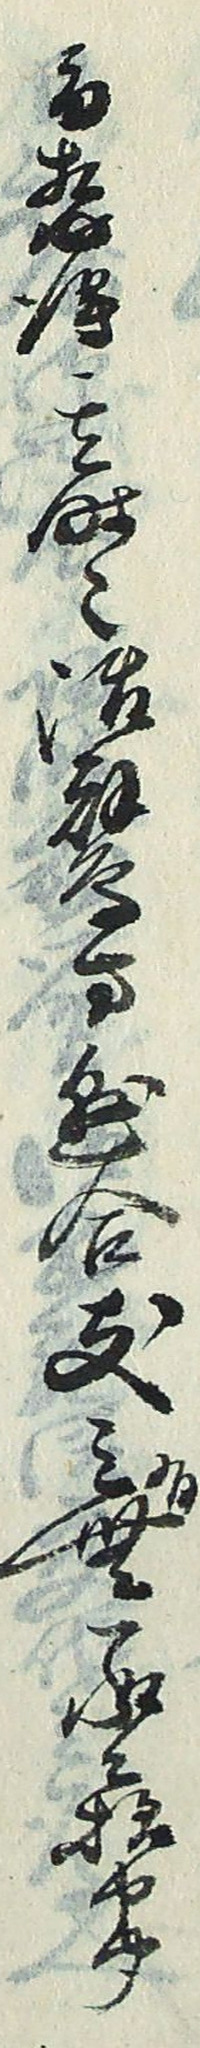方相心得其時之御鷹方懸合支之有無承候様申聞
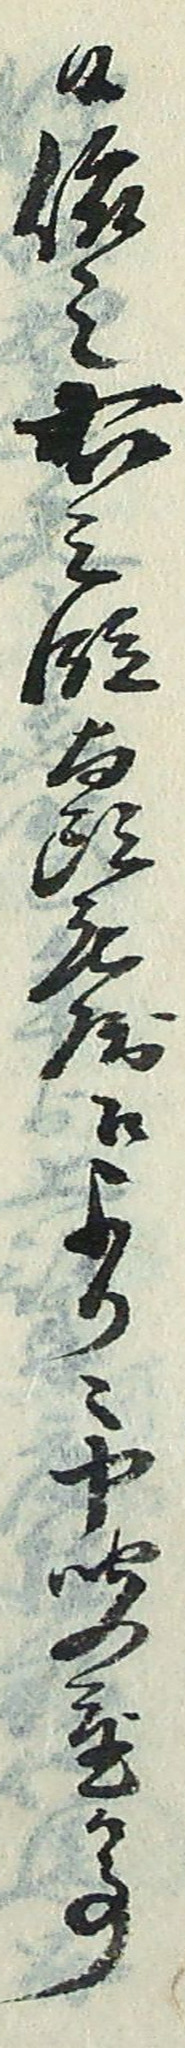候依之右之段与頭庄屋江より々申聞置候事
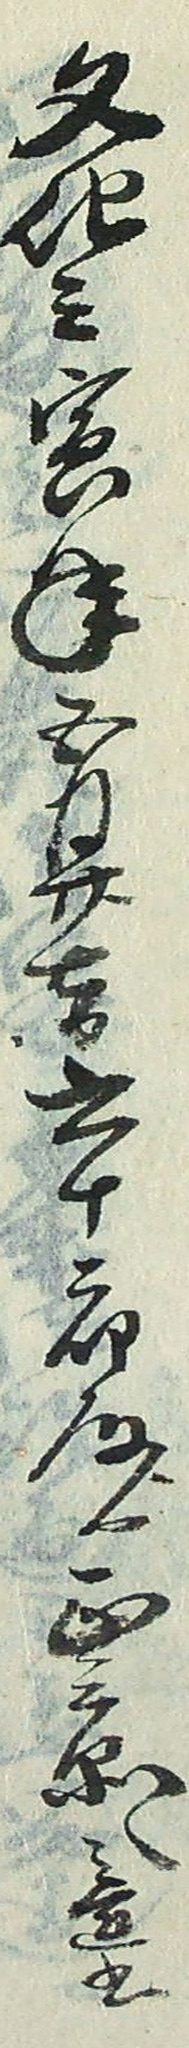文化三寅年五月廿七日六十郎殿ゟ正兵衛へ之運書
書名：諸御趣意書并御下知向之写
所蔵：鳴門教育大学 Naruto University of Education
